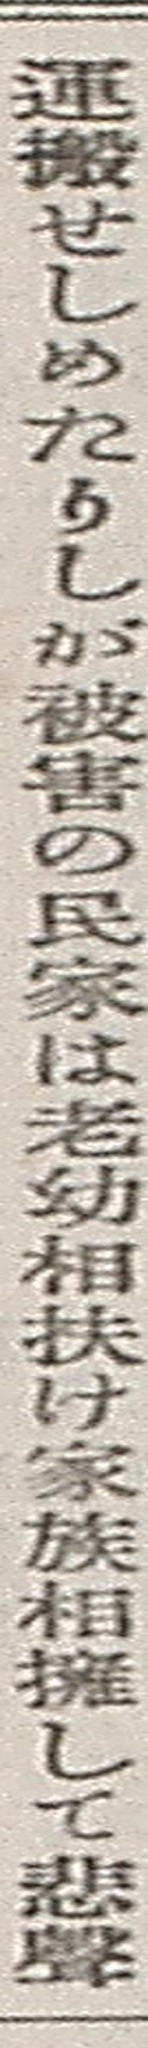運搬せしめたりしが被害の民家は老幼相扶け家族相擁して悲声
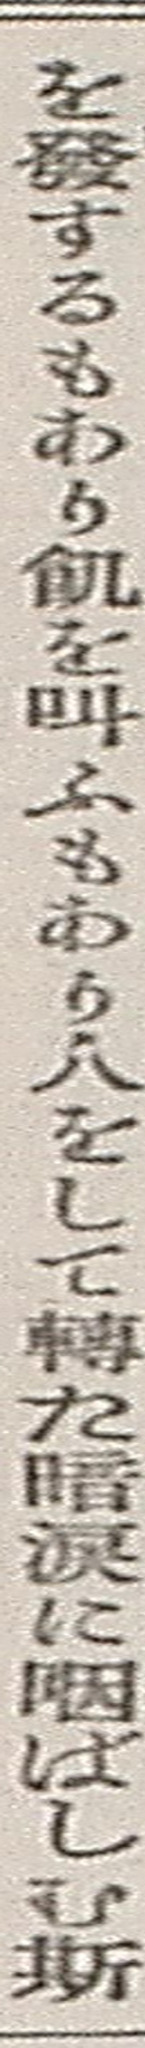を発するものあり飢を叫ふもあり人をして転た暗涙に咽ばしむ斯
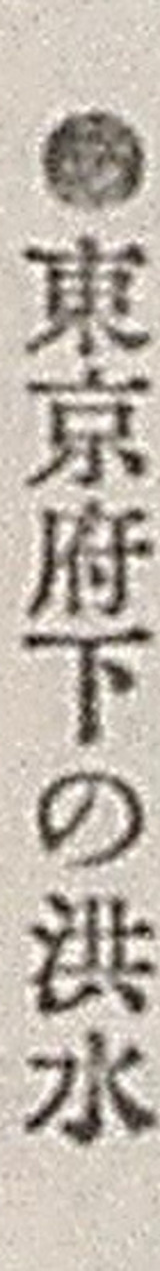●東京府下の洪水
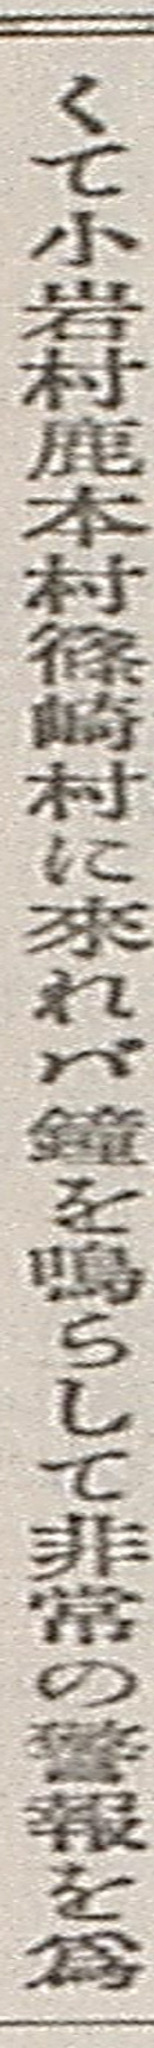くて小岩村鹿本村篠崎村に来れば鐘を鳴らして非常の警報を為
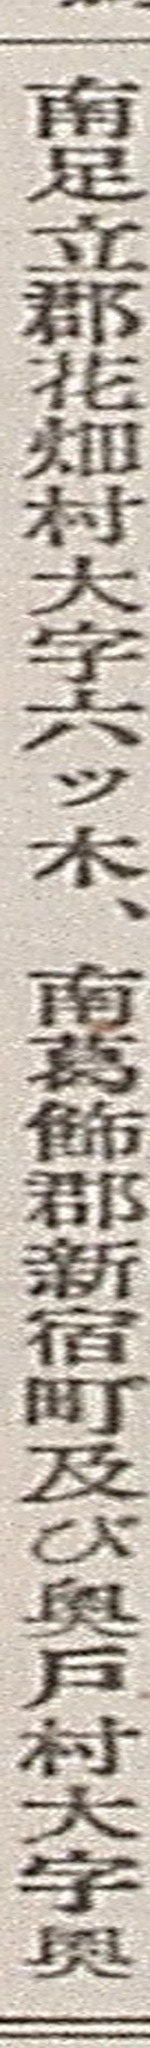南足立郡花畑村大字六ツ木、南葛飾郡新宿町及び奥戸村大字奥
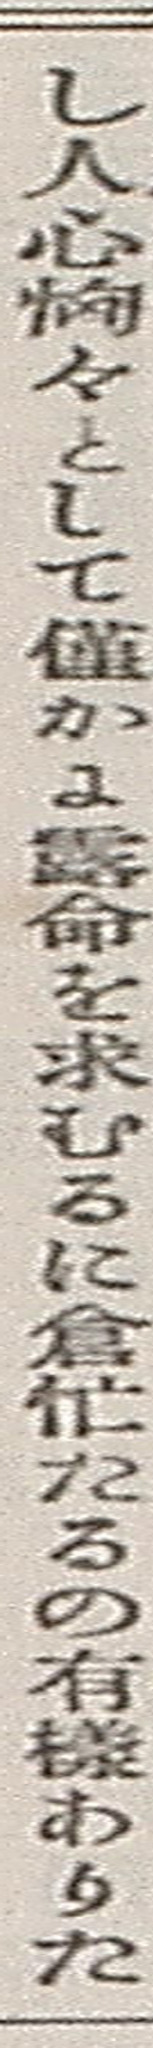し人心恟々として僅かに露命を求むるに倉忙たるの有様ありた
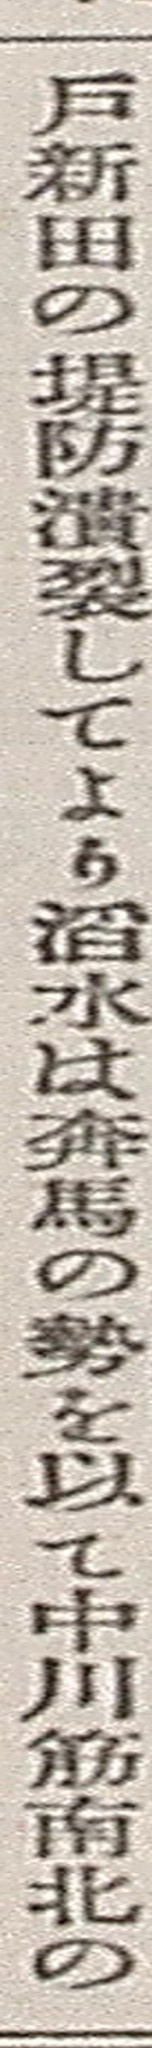戸新田の堤防潰裂してより滔水は奔馬の勢を以て中川筋南北の
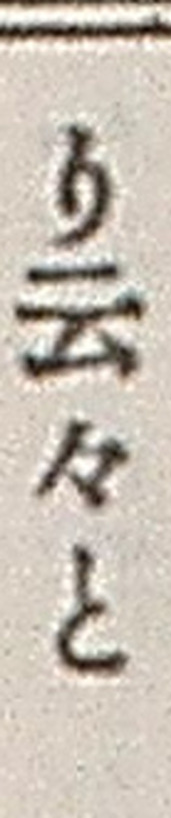り云々と
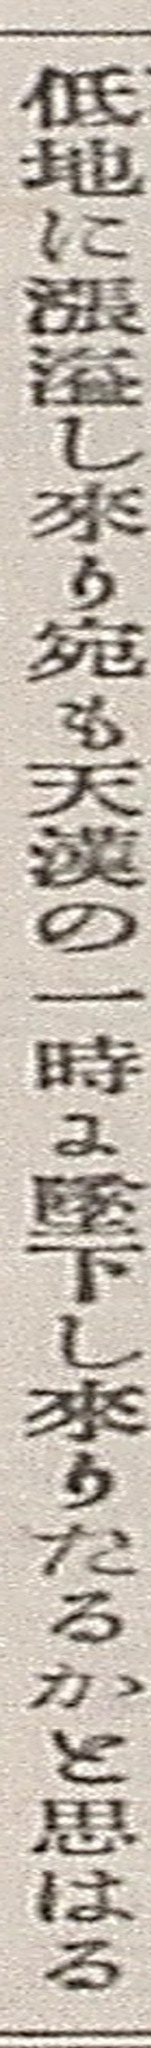低地に漲溢し来り宛も天漢の一時に墜下し来りたるかと思はる
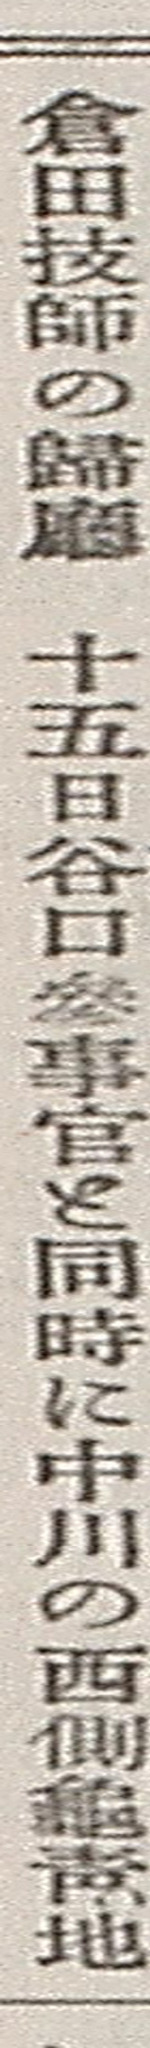倉田技師の帰庁十五日谷口参事官と同時に中川の西側亀青地
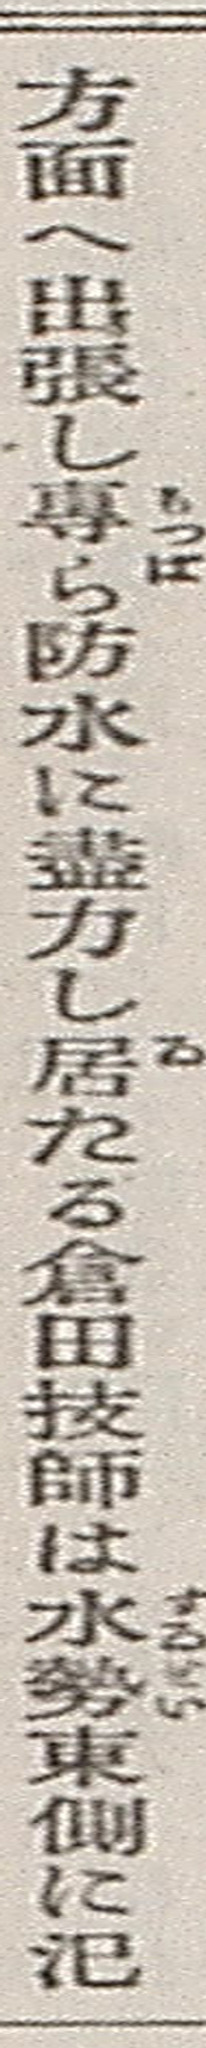方面へ出張し専ら防水に尽力し居たる倉田技師は水勢東側に氾
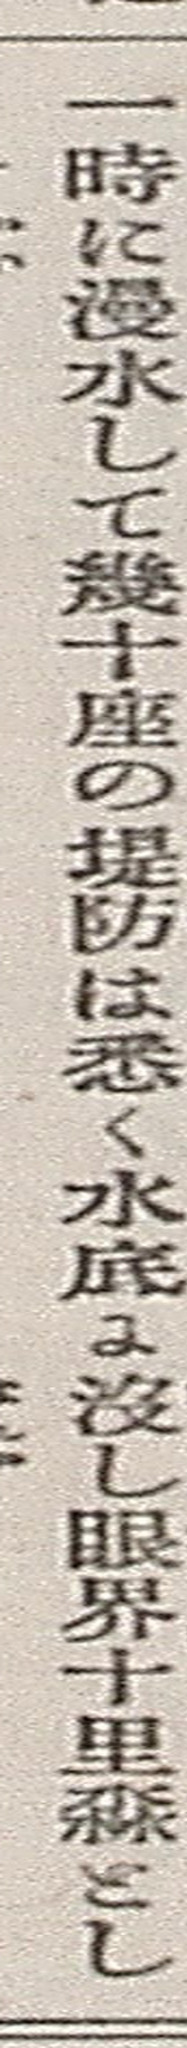一時に漫水して幾十座の堤防は悉く水底に没し眼界十里淼とし
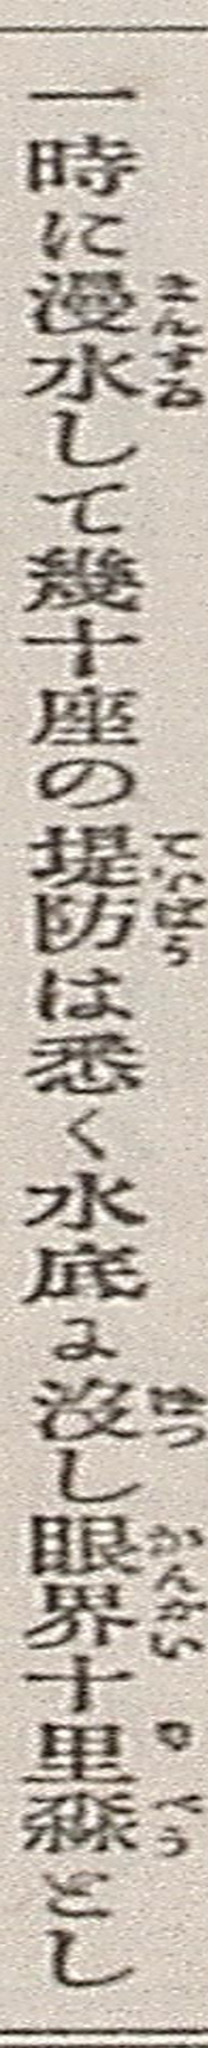一時に漫水して幾十座の堤防は悉く水底に没し眼界十里淼とし
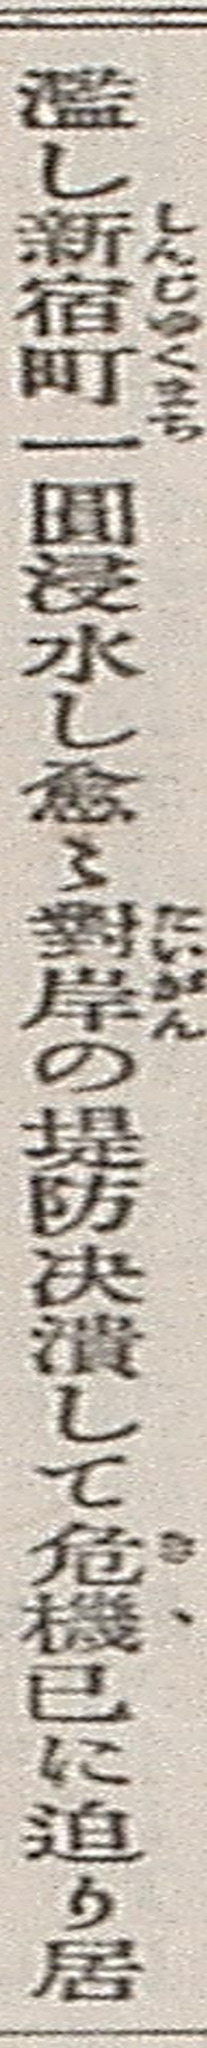濫し新宿町一円浸水し愈々対岸の堤防決潰して危機已に迫り居
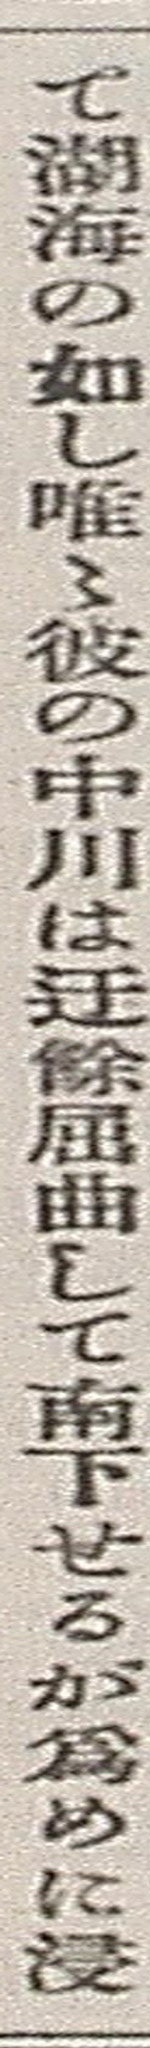て湖海の如し唯々彼の中川は紆余曲折して南下せるが為めに浸
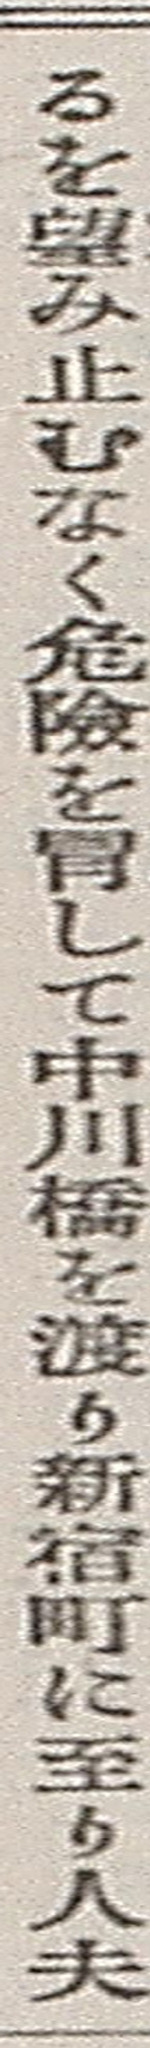るを望み止むなく危険を冒して中川橋を渡り新宿町に至り人夫
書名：風俗畫報臨時増刊第百二十四號　洪水地震被害録（上）
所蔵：東京大学地震研究所図書室 Earthquake Research Institute Library, The University of Tokyo, JAPAN
